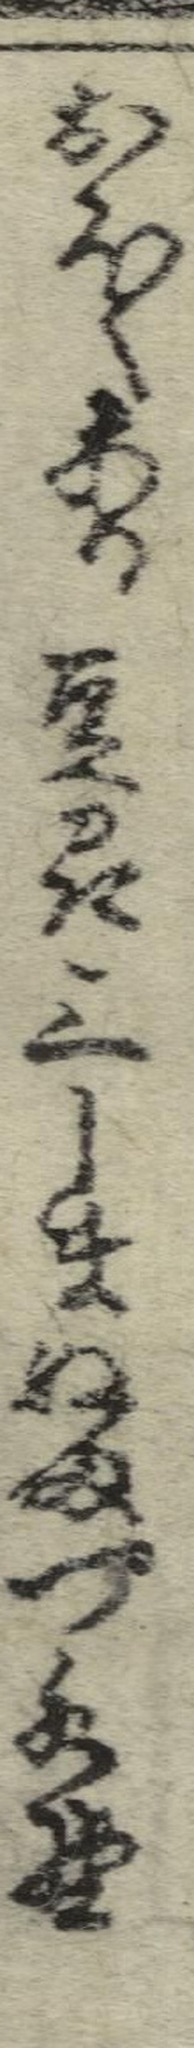おほくあり豆洲みしまぬまづ水野
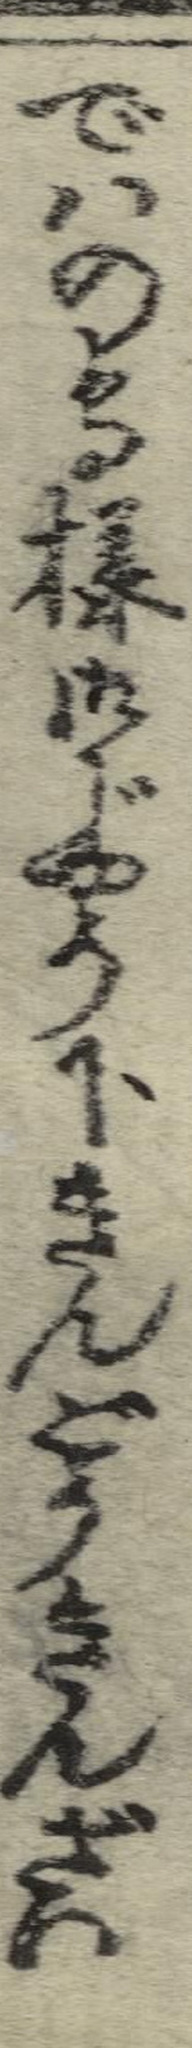ではの守様御じやう下きんごうきんざいは
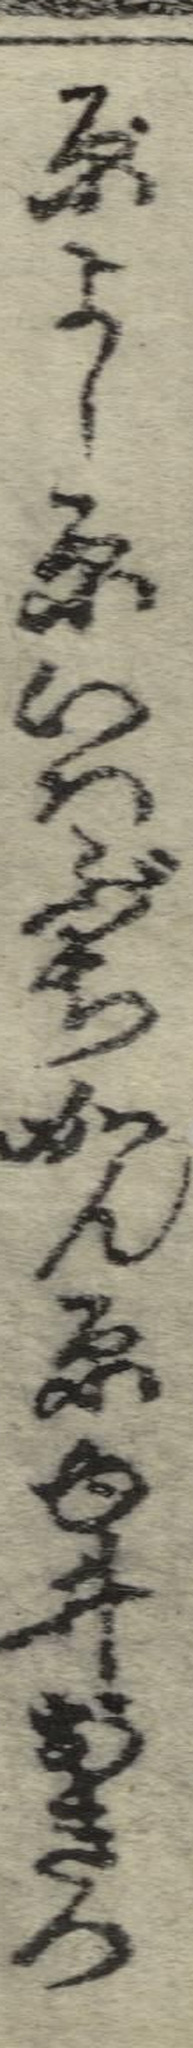原よし原いはぶちかん原ゆ井おき
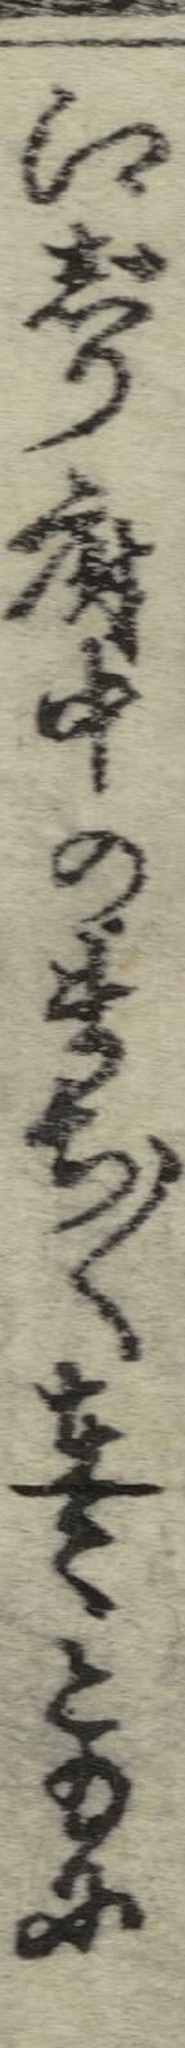江じり府中のまち〳〵在々ともに
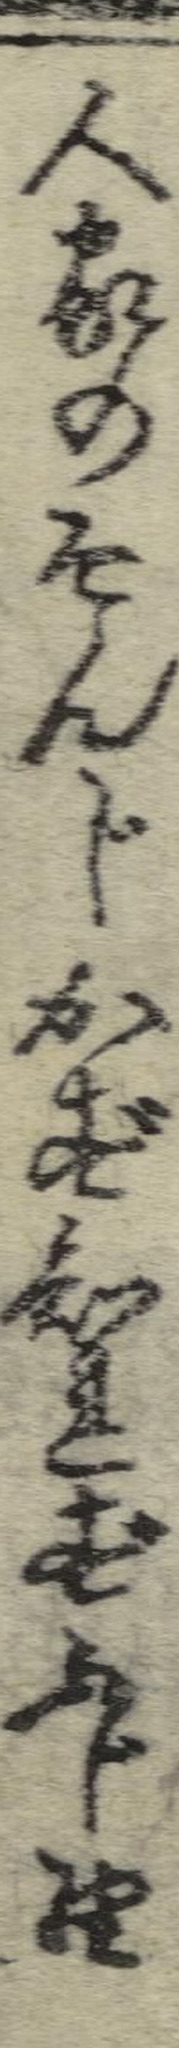人家のそんじかず知れずふじ野
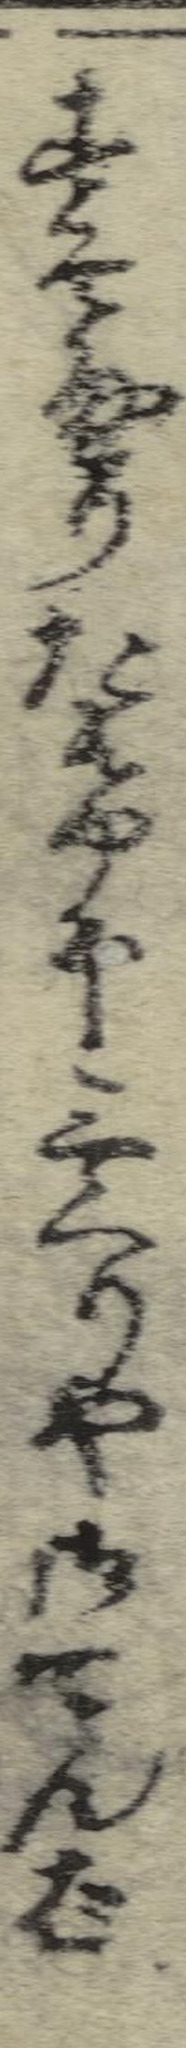すそ通りたき下三くりや御てんば
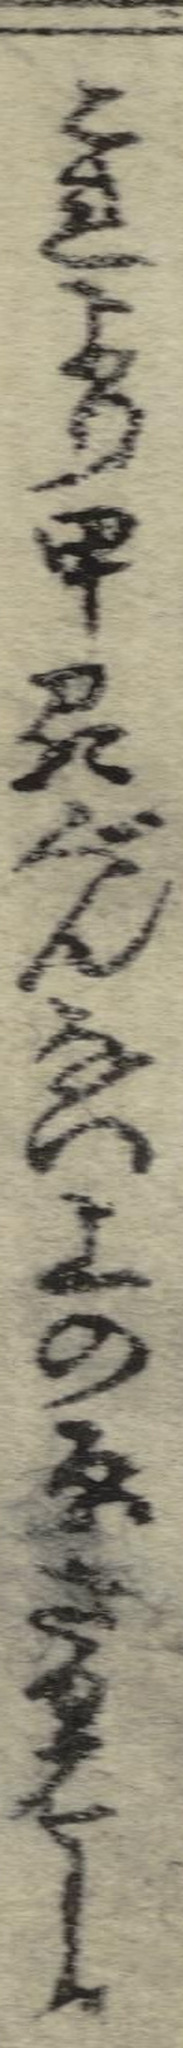これより甲州ぐんない上の原さるはし
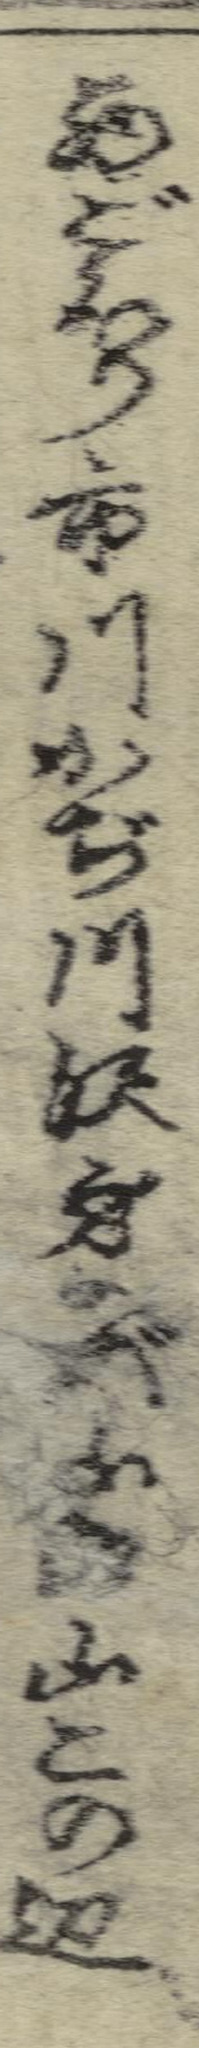西ごほり市川かぢ川沢身のぶ山この辺
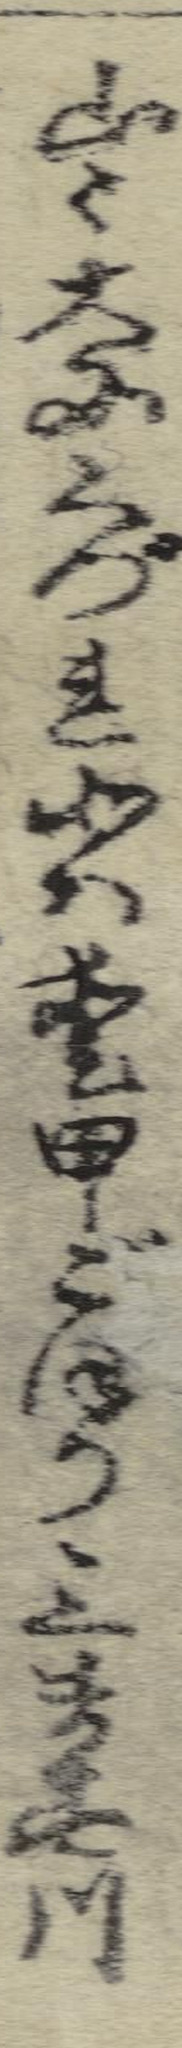山々大にくづれ北は愛甲ごほりみまつ川
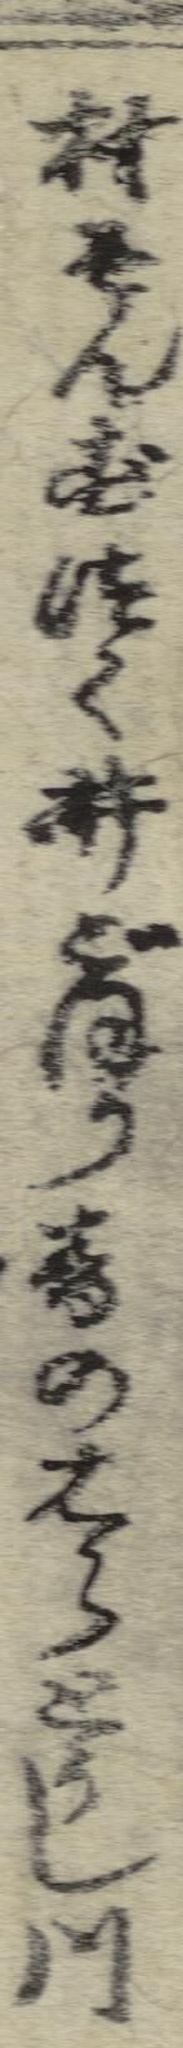村そんずつく井ごほり音のはらとうし川
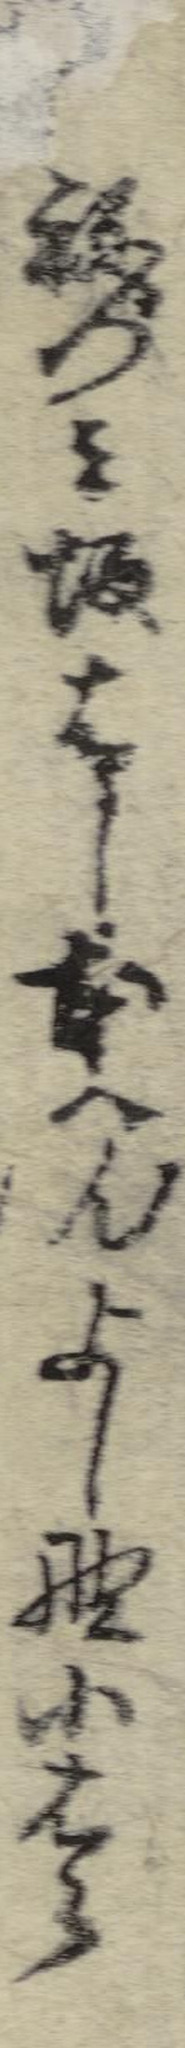ねづみ坂はし本へんよし野にはら
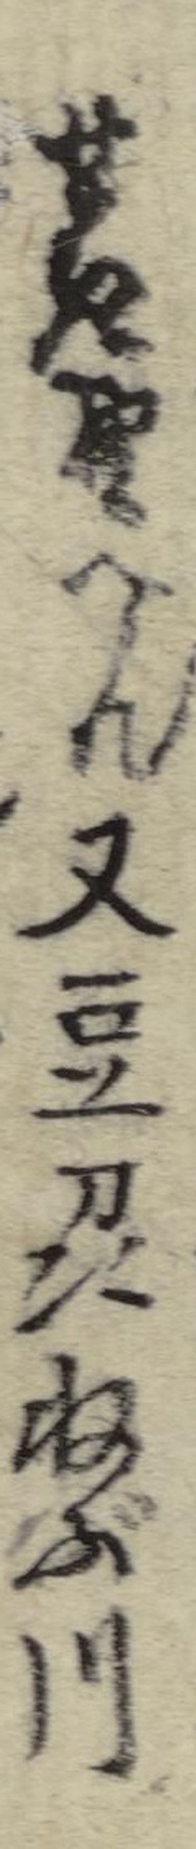せき野へん又豆洲ねば川
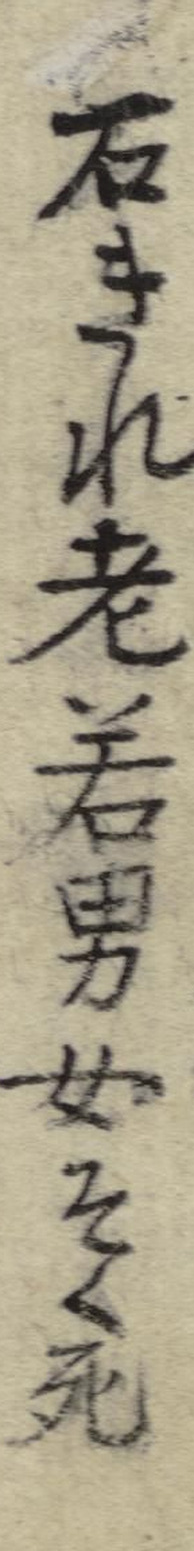石きれ老若男女そく死
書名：伊豆下田・小田原・箱根　大地震之圖
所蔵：東京大学地震研究所図書室 Earthquake Research Institute Library, The University of Tokyo, JAPAN
